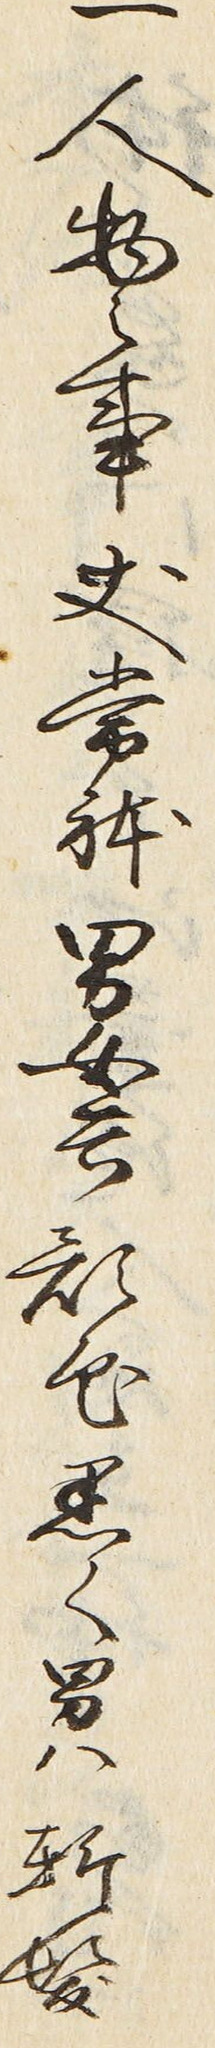一人物之事丈常躰男女共顔色黒く男は斬髪
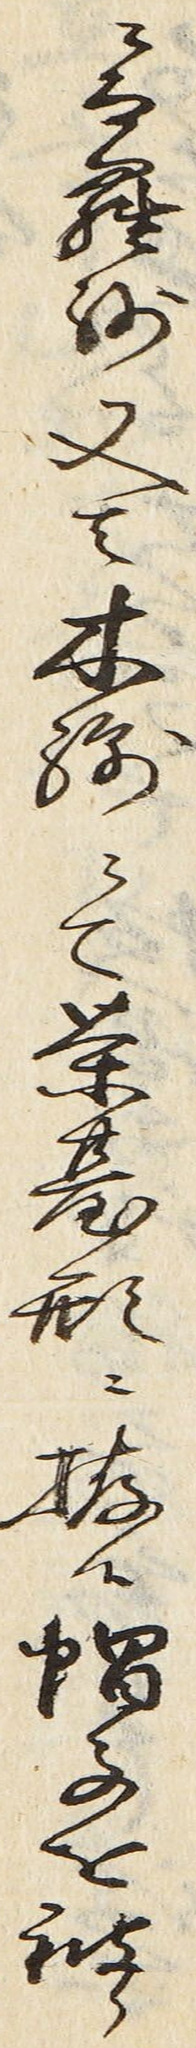に而羅紗又は木綿にて茶台形に拵候帽子を被り
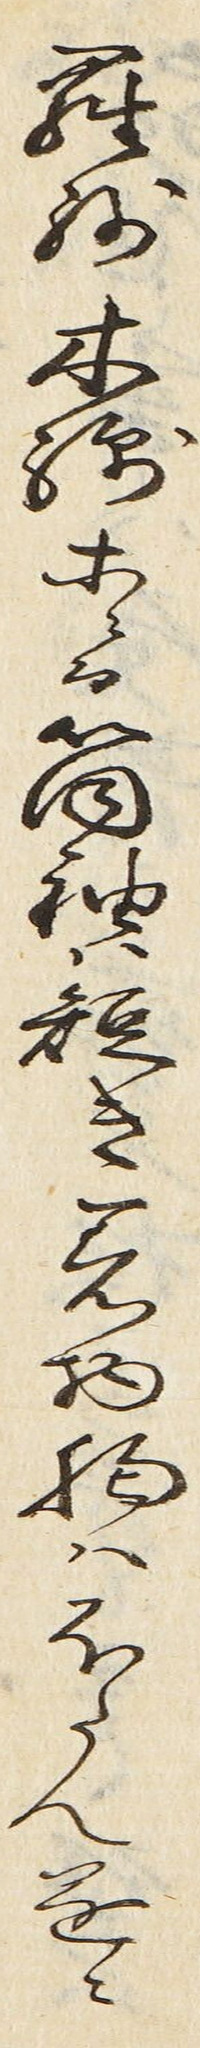羅紗木綿等に而筒袖は短き着物胸はほたん懸に
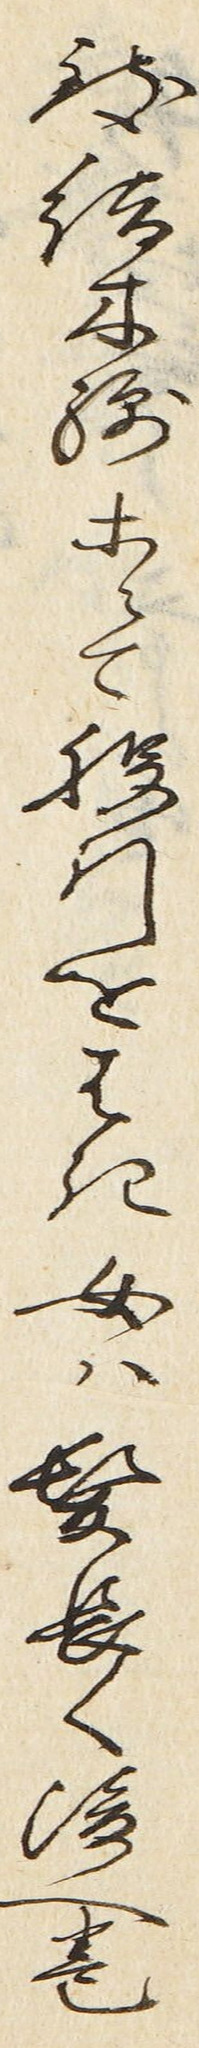致結木綿等にて股引をはき女は髪長く後へ巻
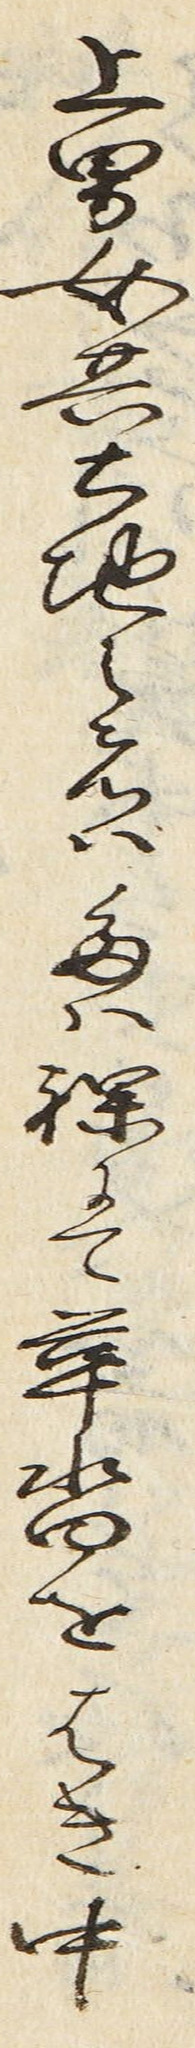上男女共土地之者は多は裸にて革沓をはき中
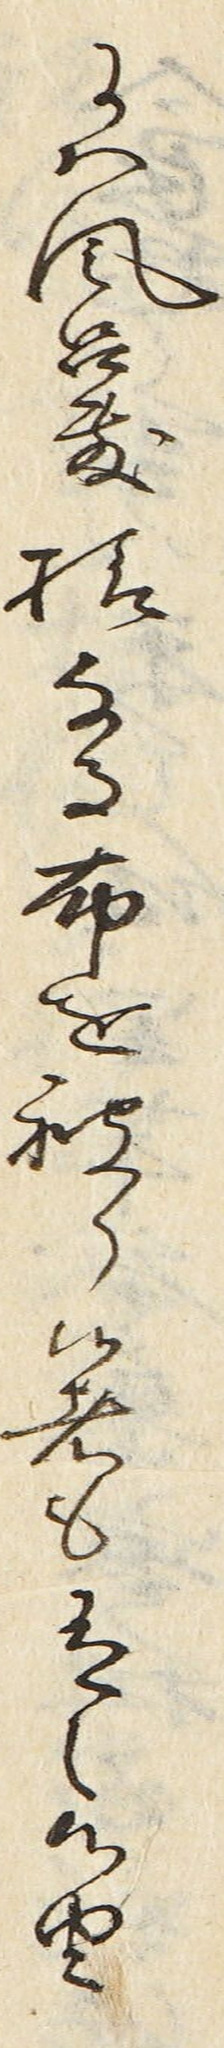には風呂敷様なる布を被り候者も有之候由

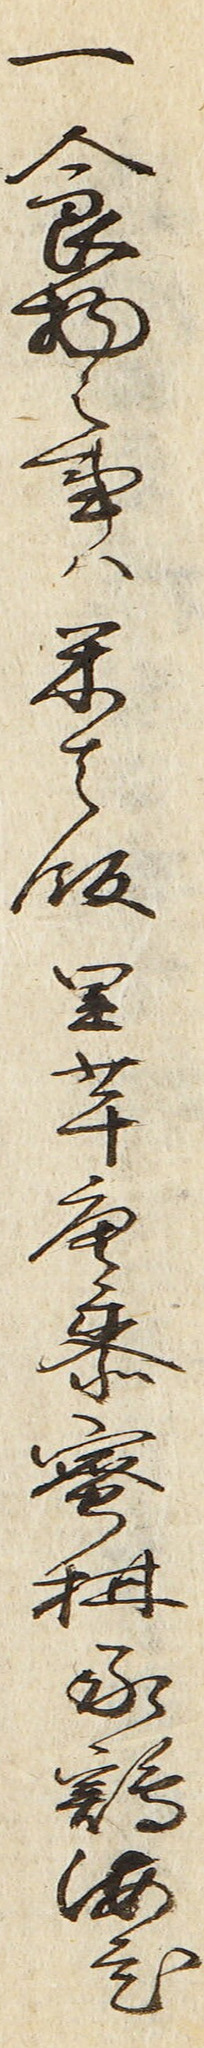一食物之事は米は飯里芋唐黍蜜柑豕鶏海老
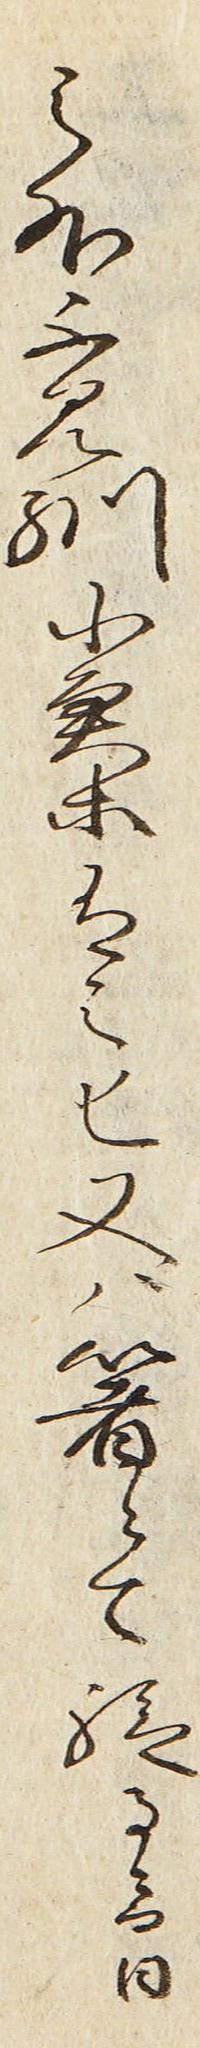之外不見馴小魚等有之匕又は箸にて給るに而日
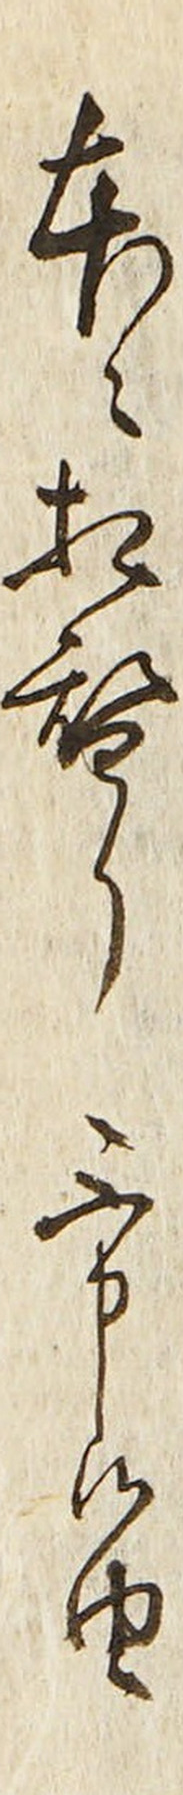本に相替り不申候由
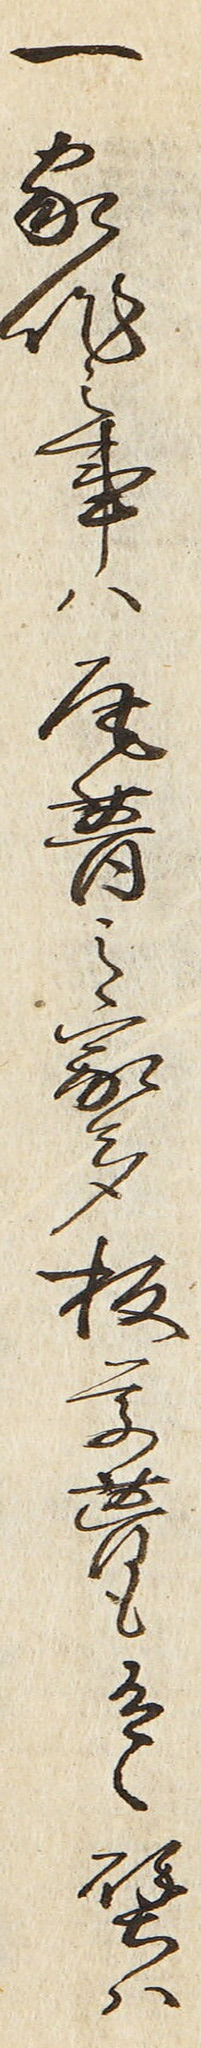一家作之事は瓦葺之家多板草葺も有之壁は
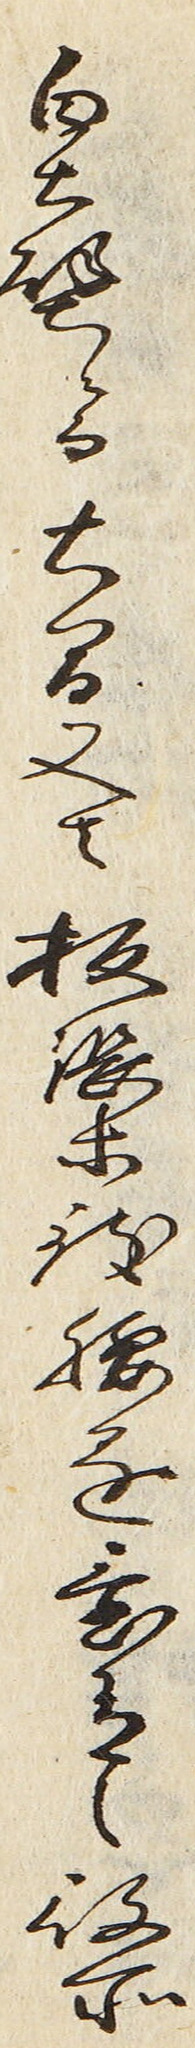白土壁に而土間又は板張等致腰懸置有之役所
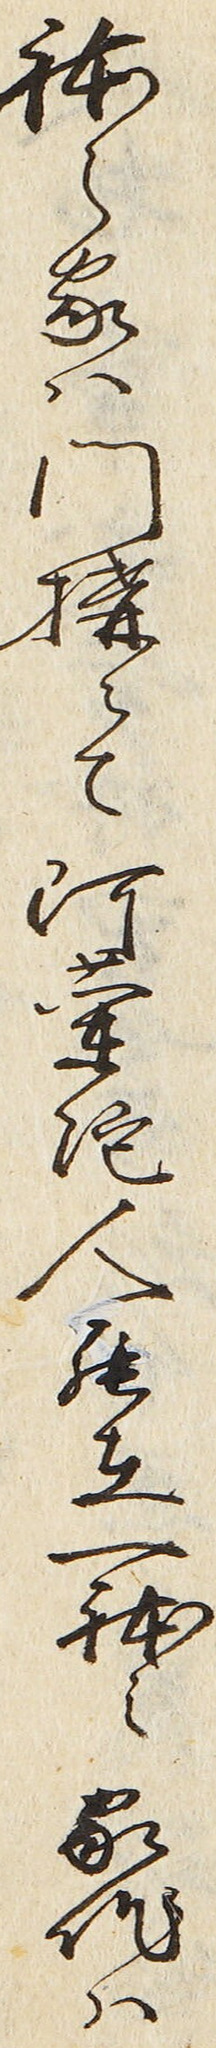躰之家は門構にて阿蘭陀人罷在一躰之家作は
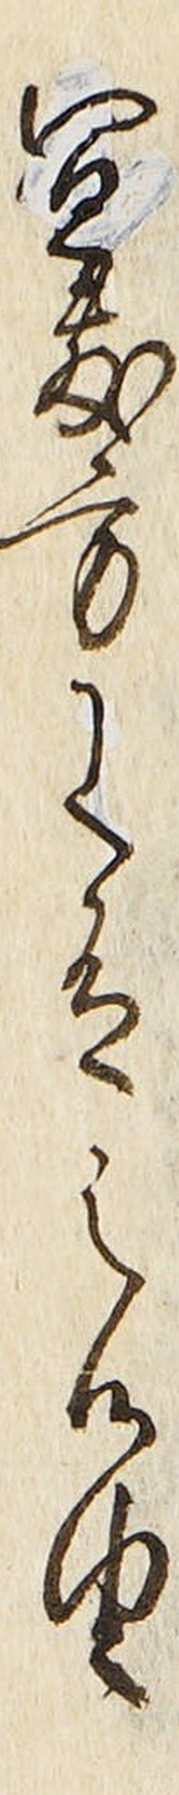宜敷方に有之候候由
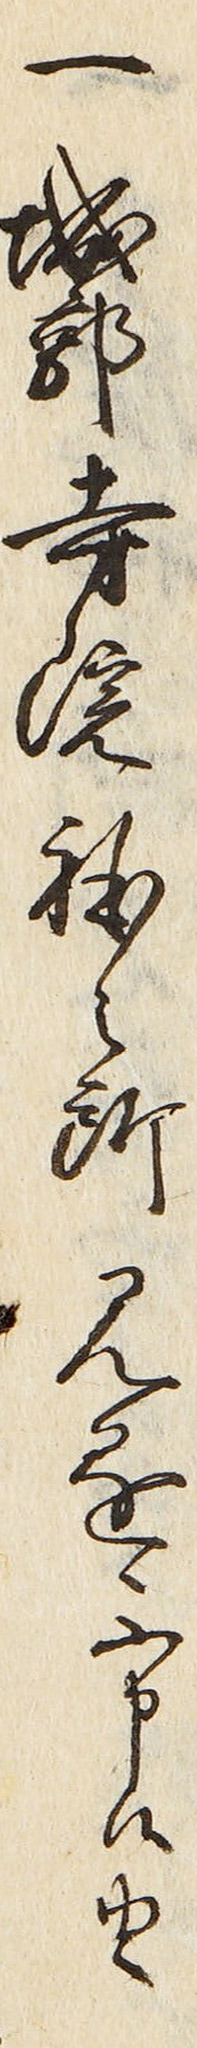一城郭寺院躰之所見懸不申候由
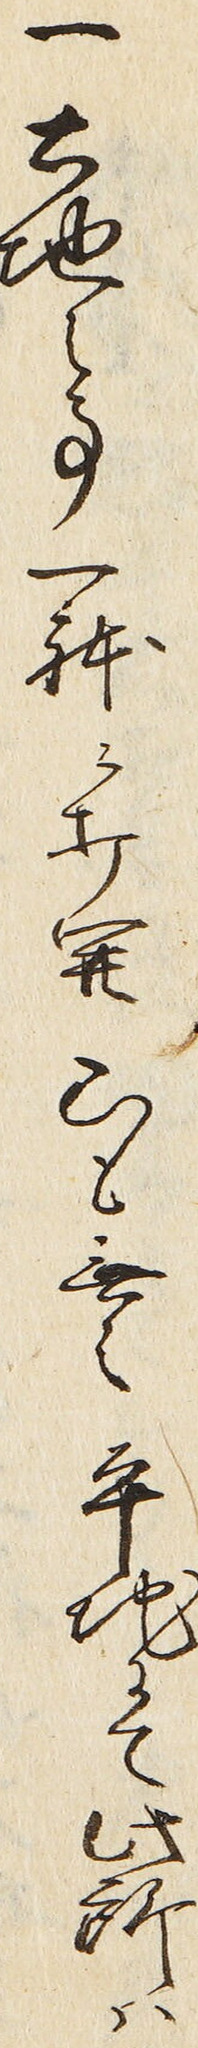一土地之事一躰に打開山も無之平地にて此所は
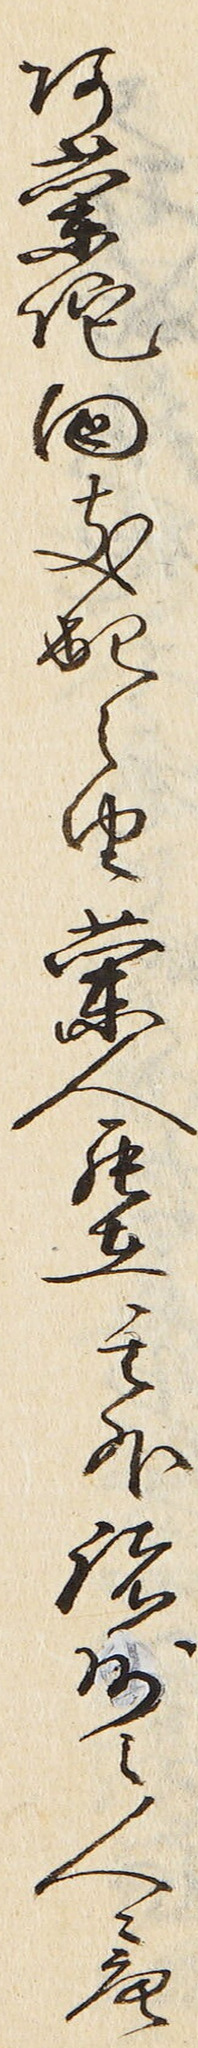阿蘭陀国支配之由蘭人罷在其外諸州之人に唐
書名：土佐中浜万次郎漂流記
